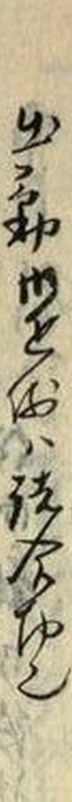出勤御近例ハ詰合切也
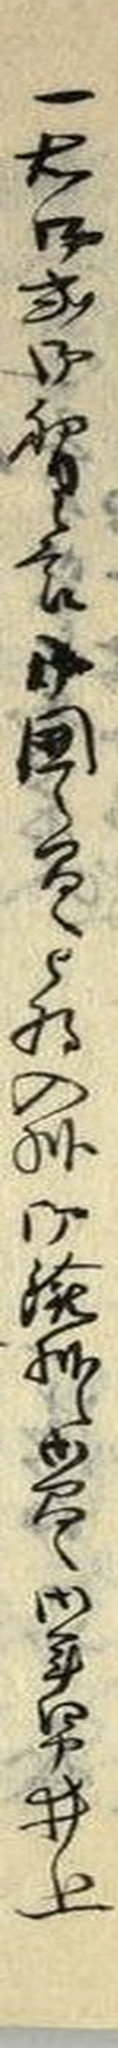一右御式御初り之節御囲之間へ被為入掛御鎗掛之御間へ御年男井上
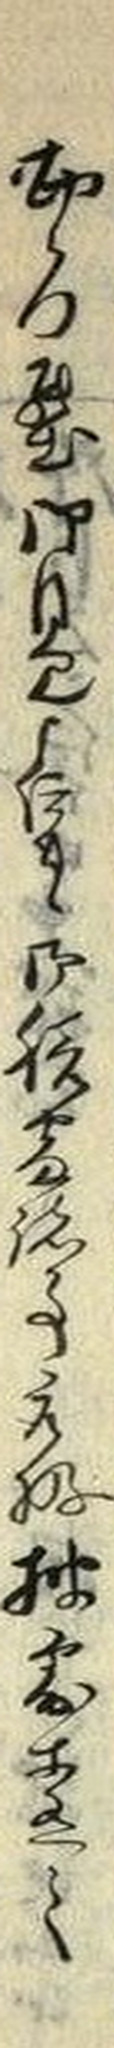勘右衛門罷出御目見被仰付候御膳番諸事取扱披露等有之
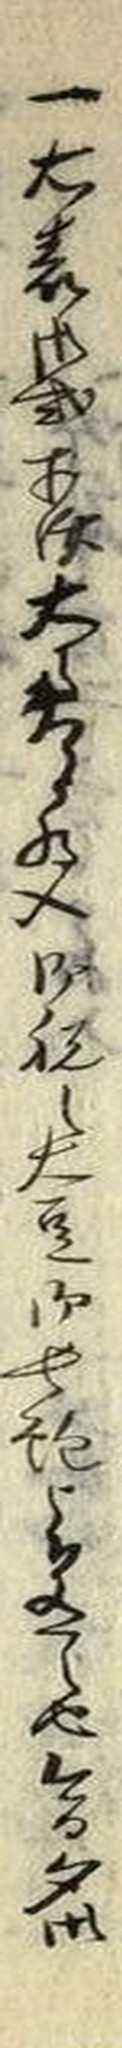一右表御式相済大奥へ被為入御祝之大豆御長鮑被下有之由今日夕御
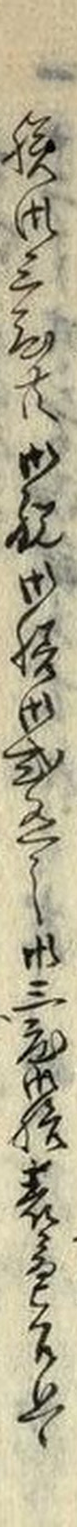膳御三度共御祝御膳御式有之御三度御膳表ニ而被召上候
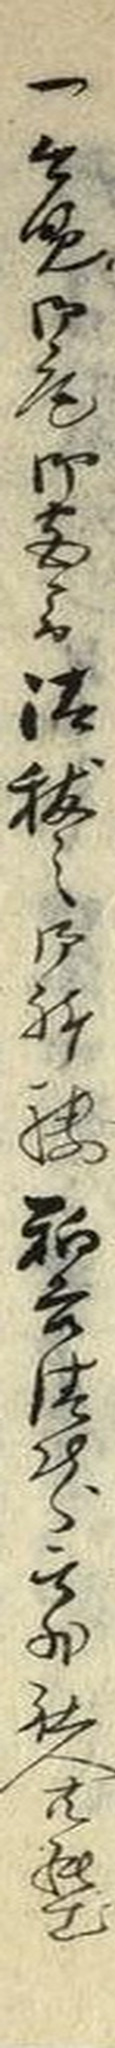一今晩御庭御宮ニ而清祓之御祈祷粕谷次郎其外社人共罷出
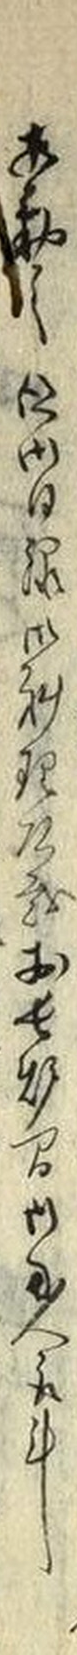相勤之但御目録御料理頂戴於長炉間御用人取計
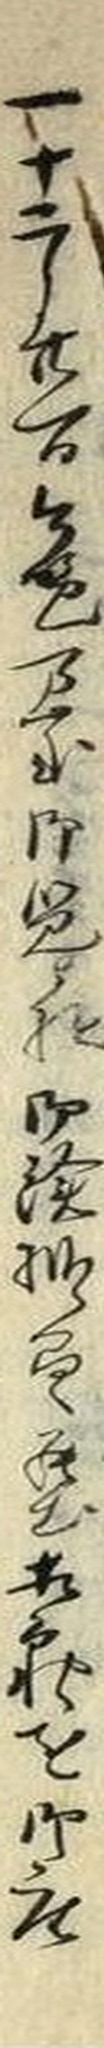一十二月廿一日今晩万歳御覧被遊御鎗掛之間へ罷出を御座
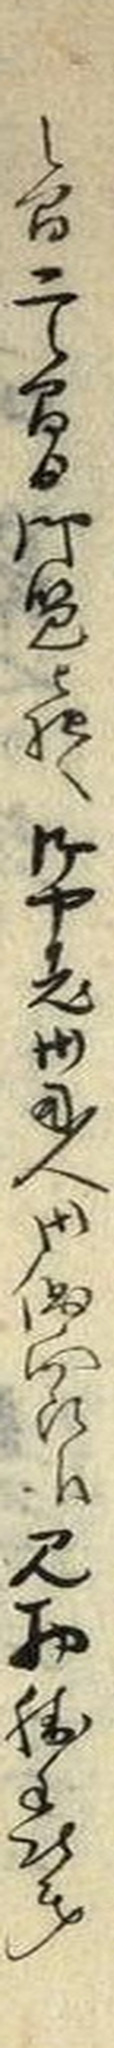之間二之間ゟ御覧被遊候御中老御用人御側向頭取江見物勝手次第
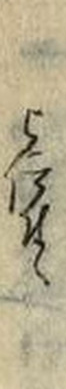被仰付候
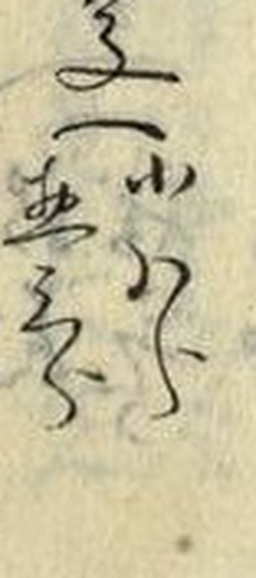惣三郎

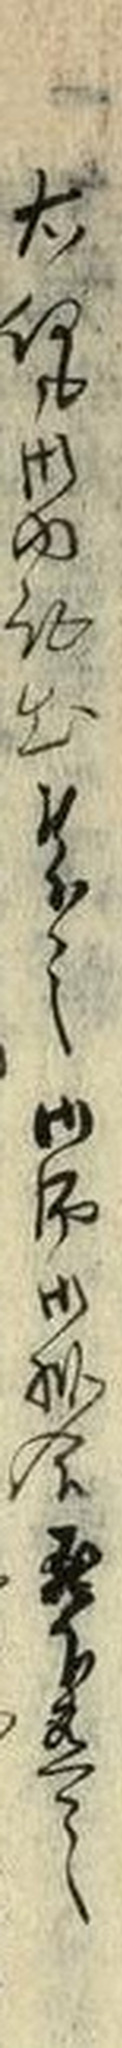右何も御内証出被下之御酒御掛合被下有之
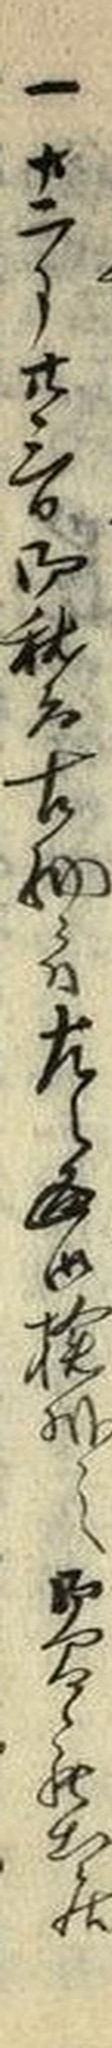一十二月廿三日御稽古納ニ付左之通御槍掛之御間へ罷出居
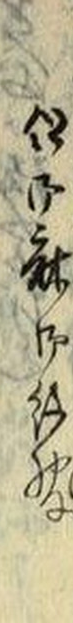但御麻御紋服
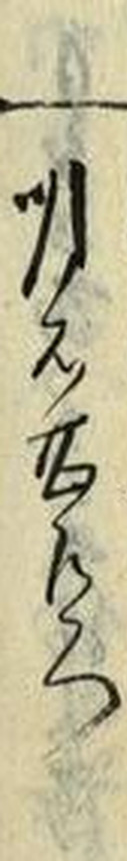明石甚左衛門
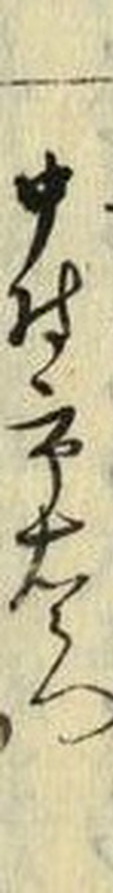中村市右衛門
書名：少傅日録抄（斉承付側向頭取日記、在国）
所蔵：福井県文書館 Fukui Prefectural Archives
